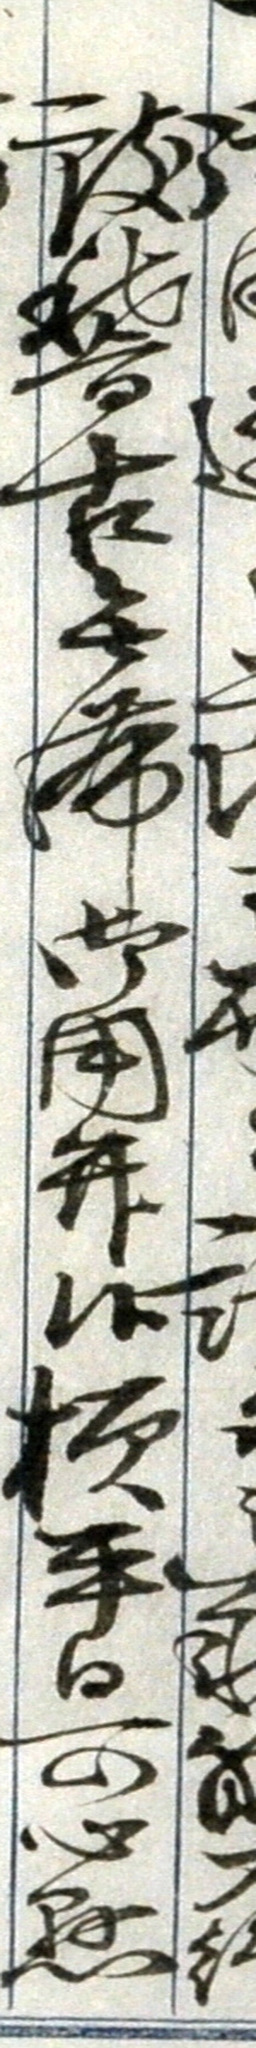致稽古無滞御用弁候様平日可心懸
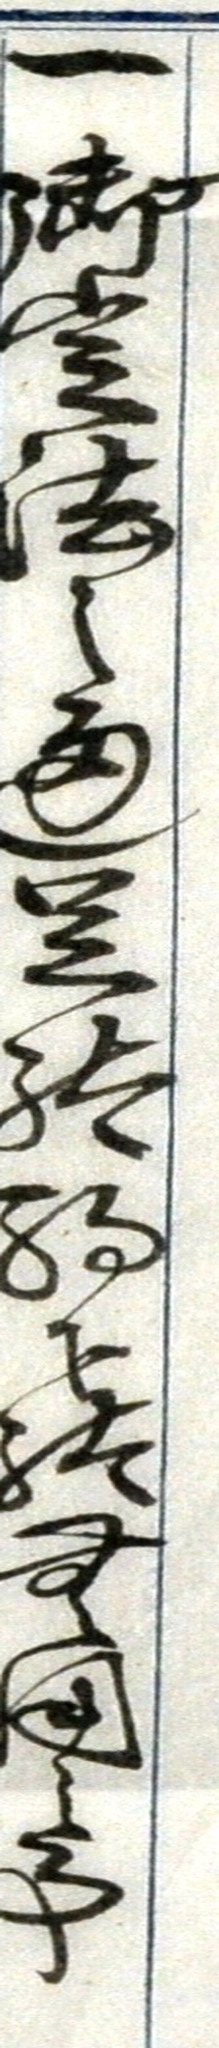一御定法之通足駄駒下駄無用之事
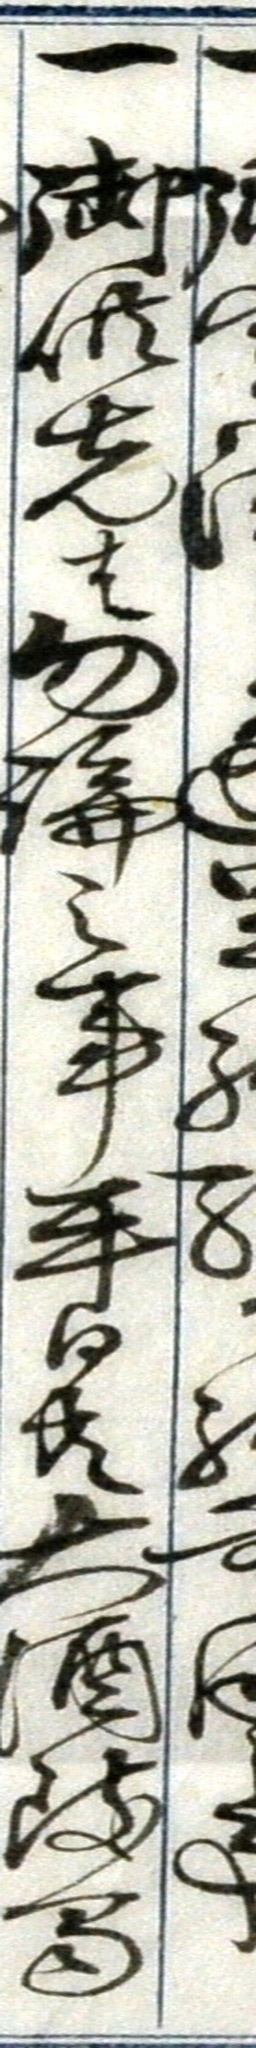一御供先は勿論之事平日共大酒致間
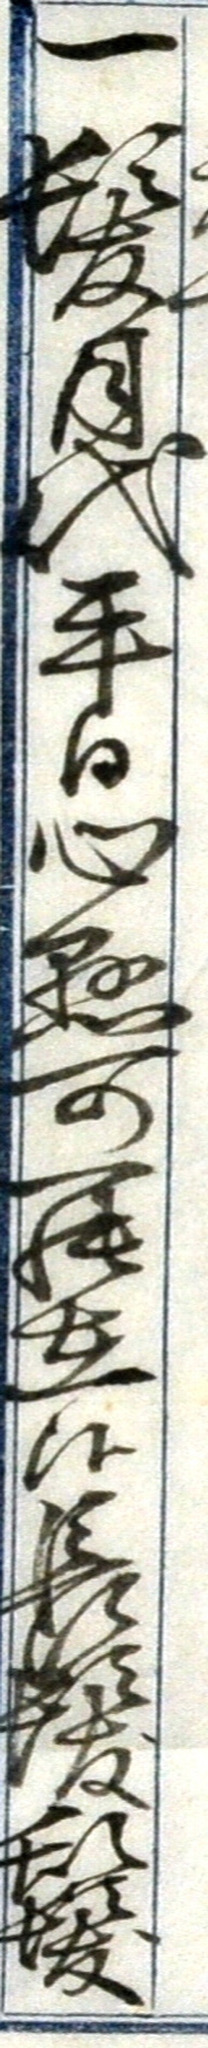一髪月代平日心懸可罷在候長髪乱髪
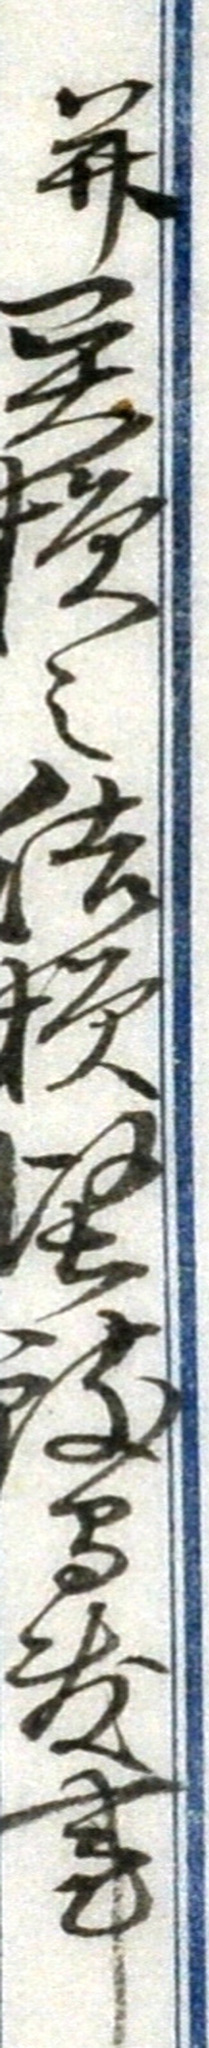并異様之結様堅致間敷事
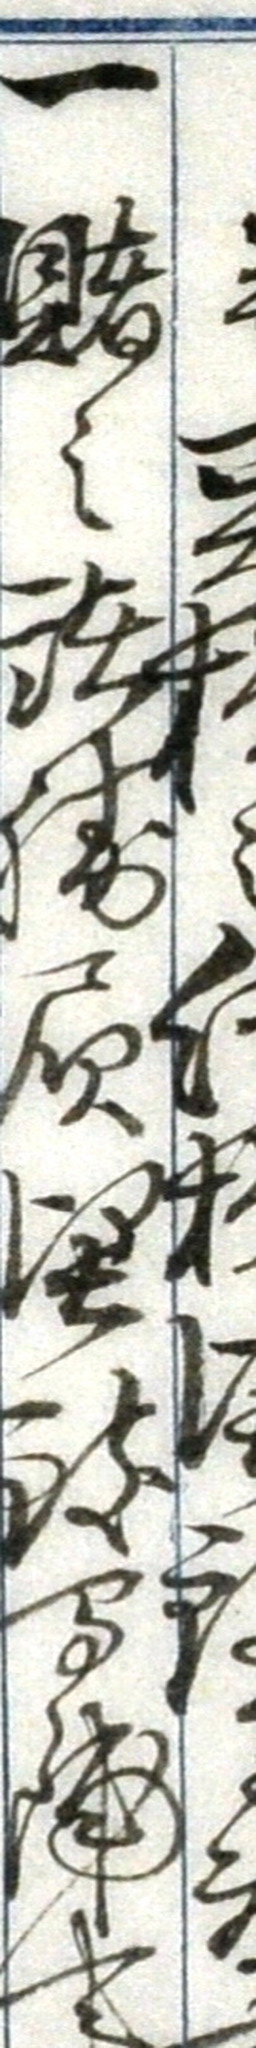一賭之諸勝負堅致間鋪事
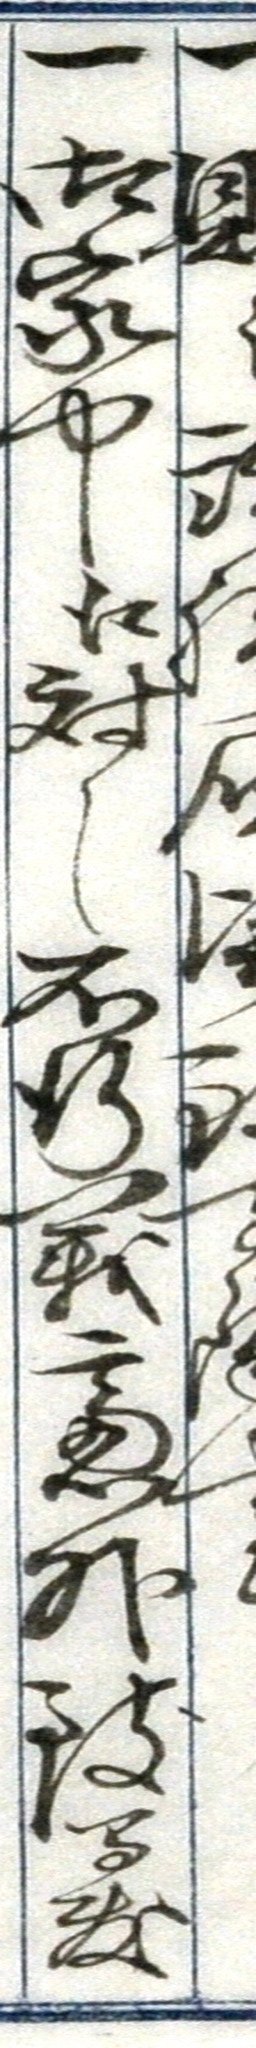一御家中え対し不行義慮外致間敷
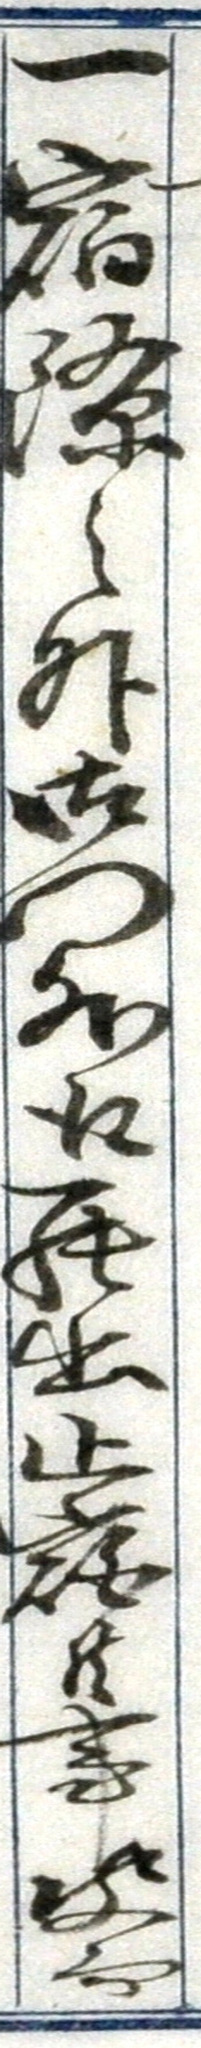一宿際之外御門外え罷出止宿候事決而
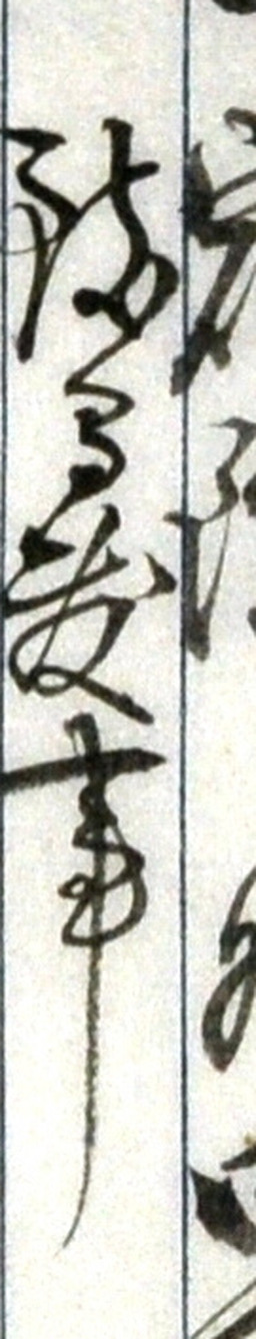致間敷事
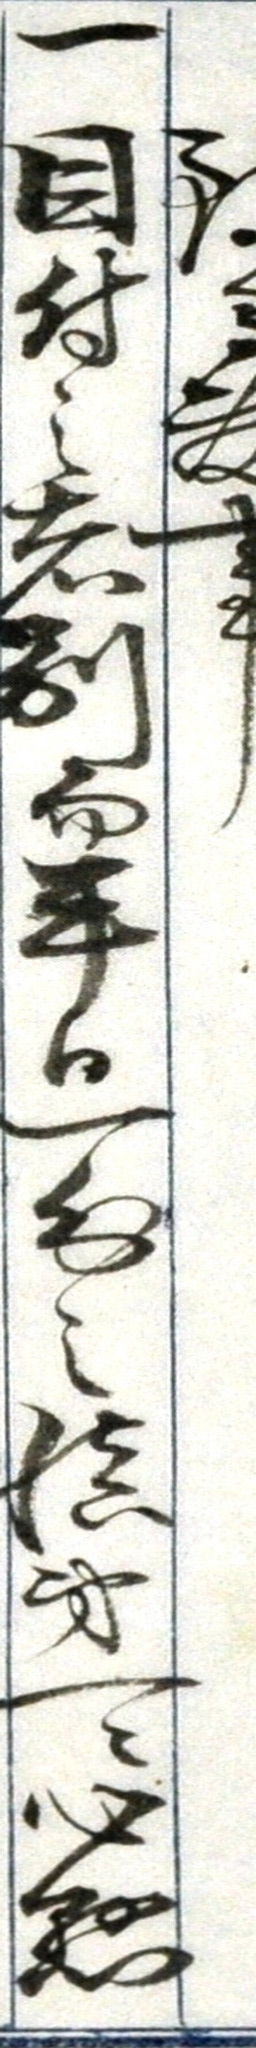一目付之者別而平日一分之慎第一と心懸
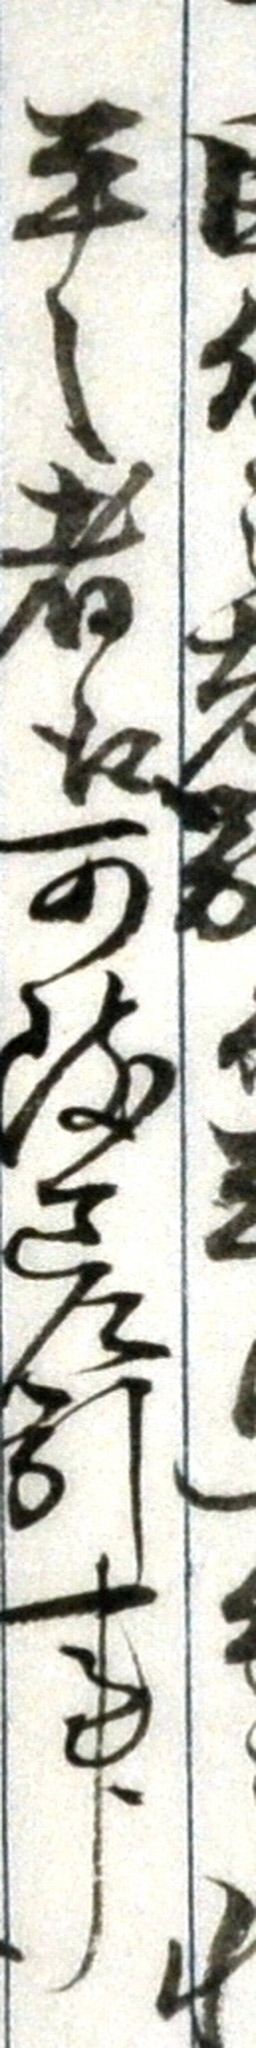平之者え可致差引事
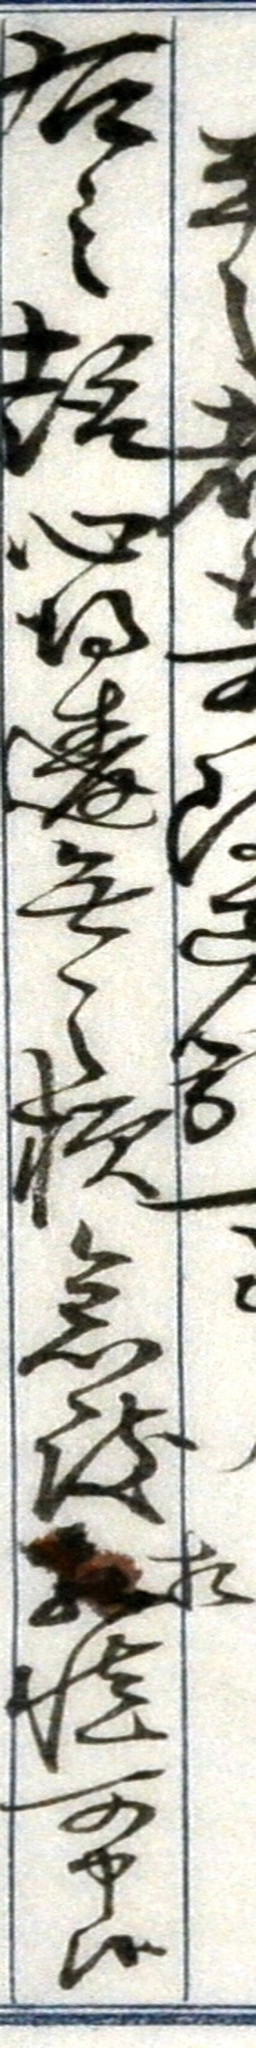右之趣心得違無之様急度相慎可申候

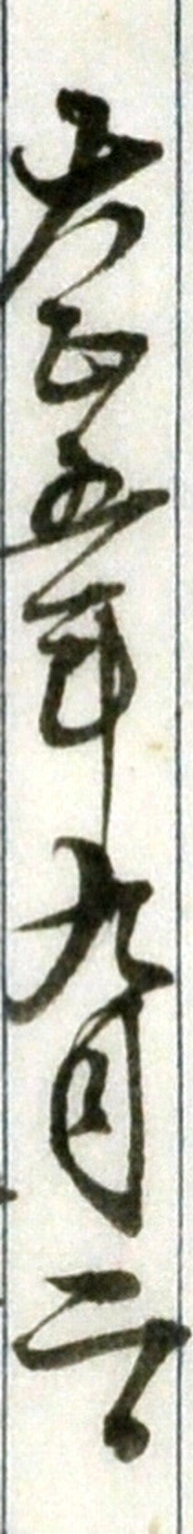大正五年九月二日
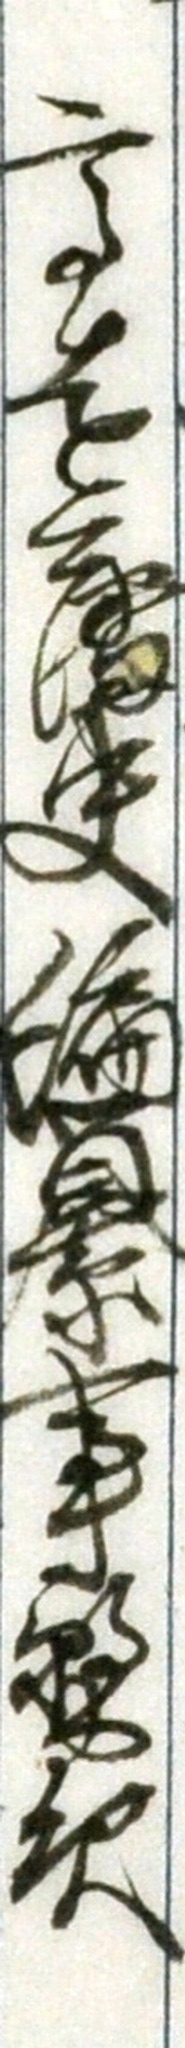高遠藩史編纂事務員
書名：御手廻之者心得覚書
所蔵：伊那市立高遠町図書館・合同会社AMANE
